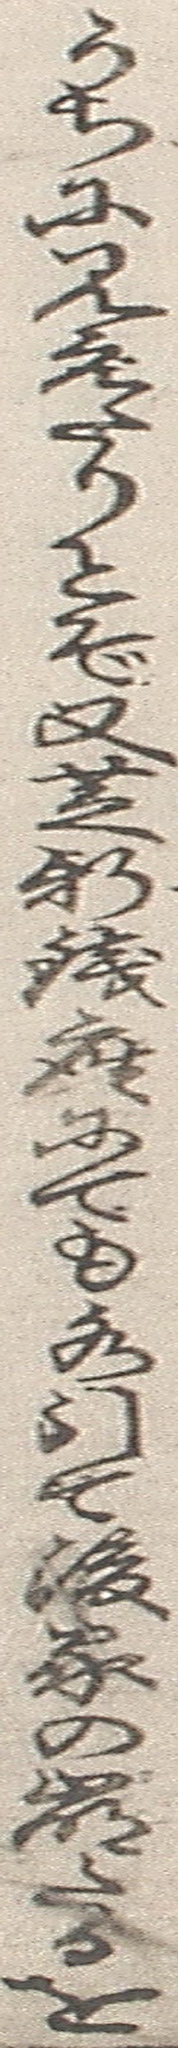うちに見えたりとぞ又芝新鮮銭座にても水引て後家の崩たるを
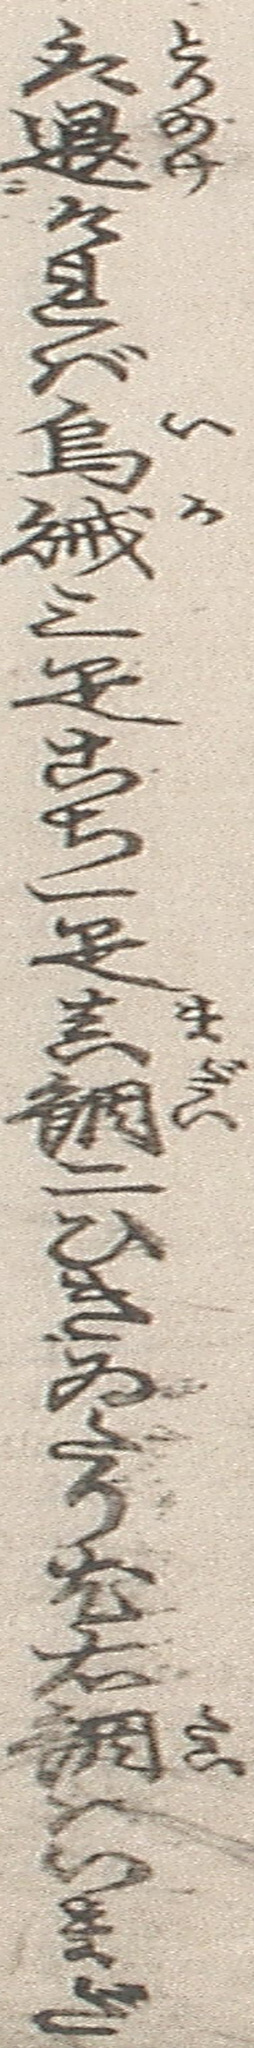取退けれバ烏賊三疋こち一疋真鯛二ひきゐたり尤右鯛ハいまだ
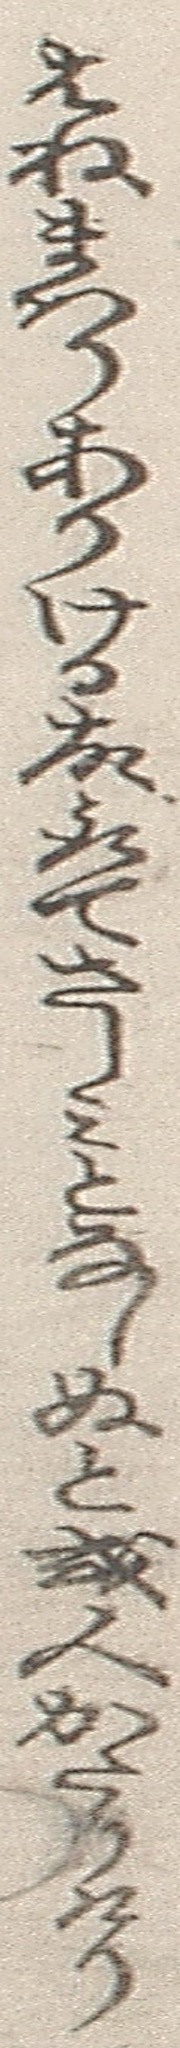はねまハりありける故取てさしミとなしぬと或人かたりたり
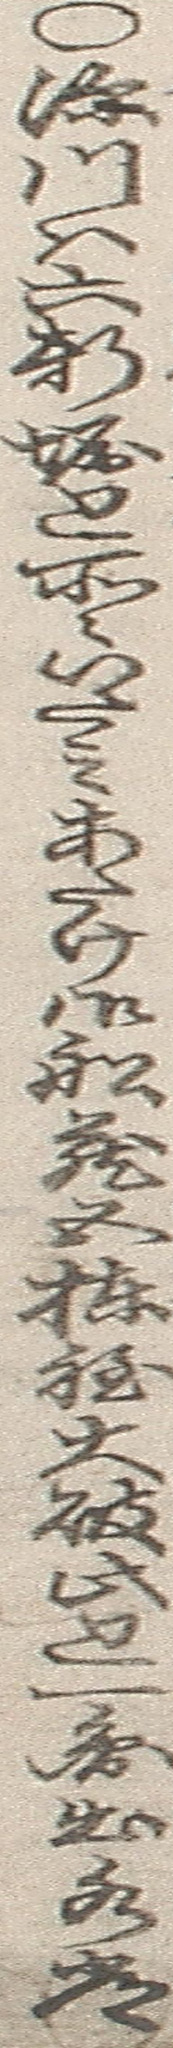◯深川ハ六軒堀辺所々いたミあたけ御船蔵五棟程大破此辺一円出水常常
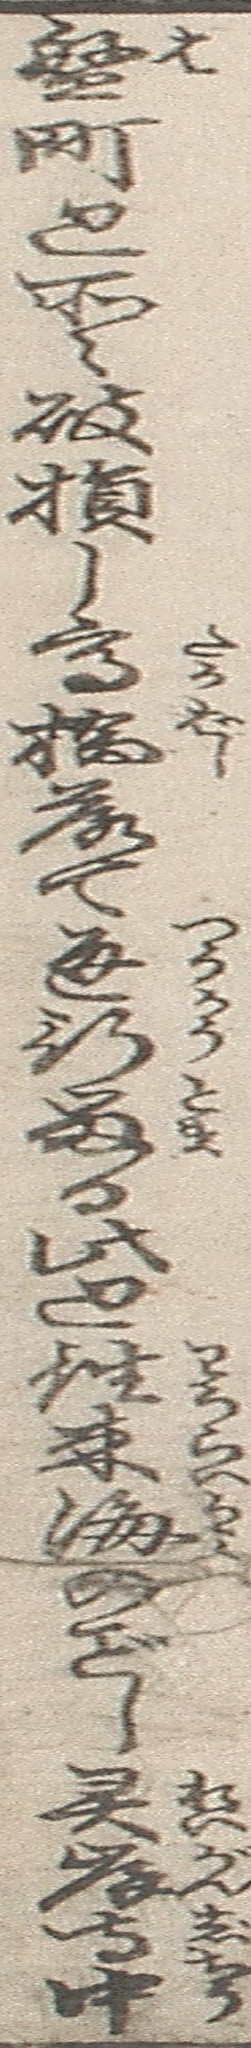盤町辺所々破損し高橋落て通路留る此辺往来海のごとし靈岸寺中

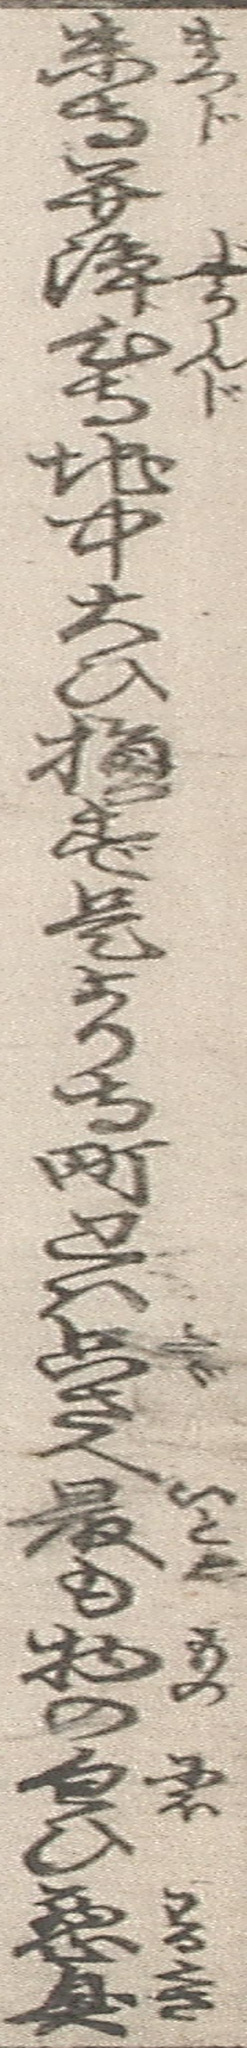末寺并淨心寺地中大ひ損ず是より寺町辺ハ只さへ最も物の匂ひ悪臭
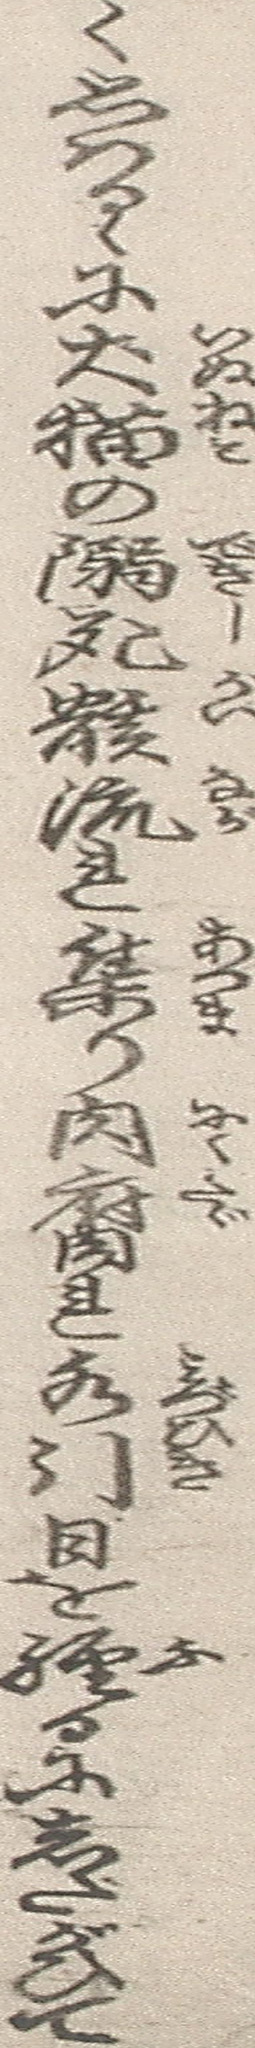く思ハるゝに犬猫の溺死骸流れ集り肉腐れ水引き日を経るにしたがひて
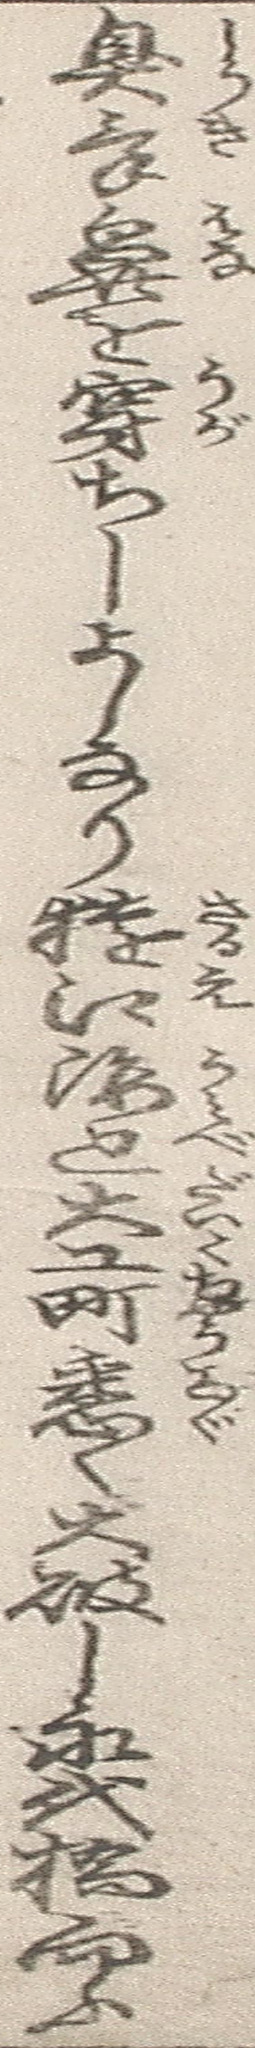臭気鼻を穿ちしよしなり猿江浦辺大工町悉く大破し永代橋向ふ
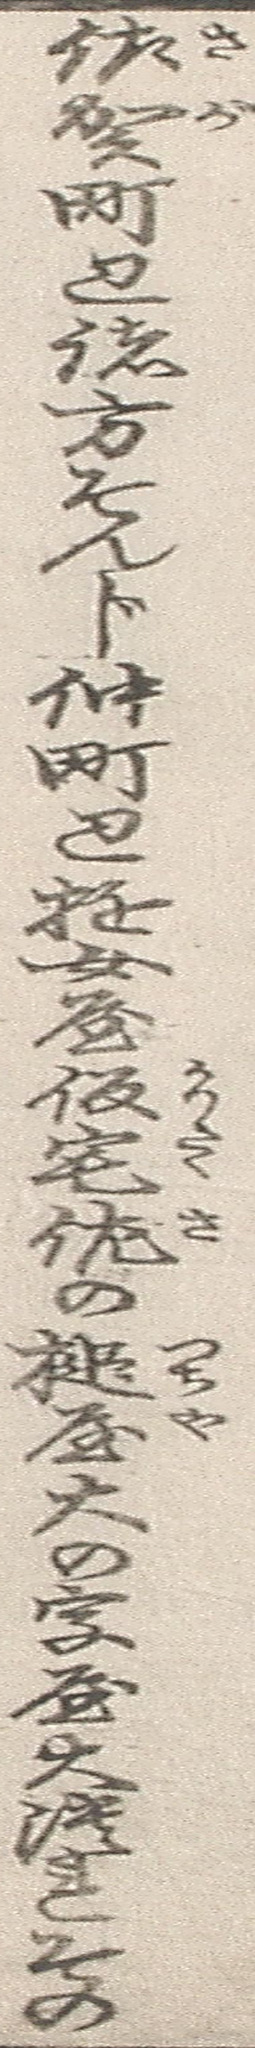佐賀町辺諸方そんじ仲町辺遊女屋仮宅佐の槌屋大の字屋大潰れその
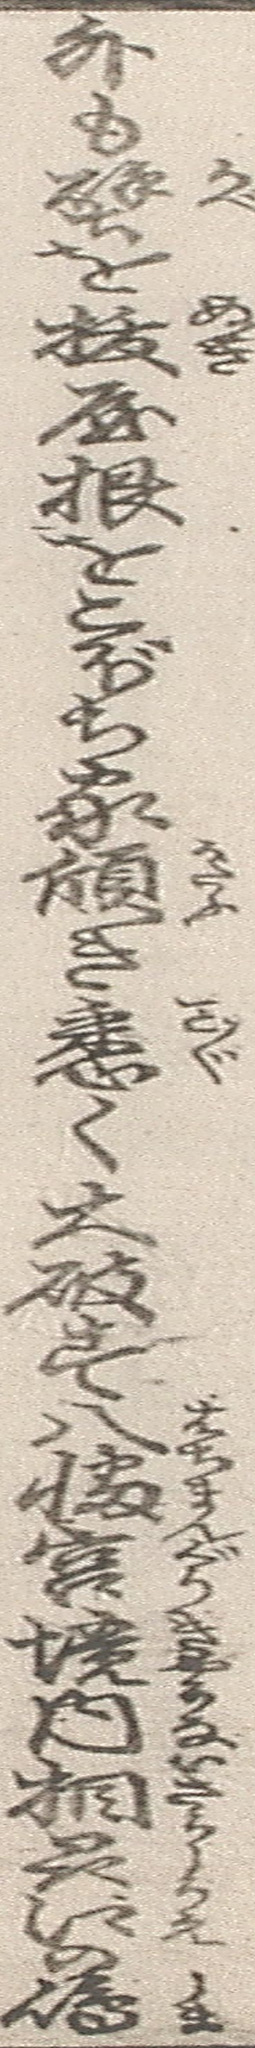外も壁を抜屋根をこぼち家傾き悉く大破す八幡宮境内相州江の嶋
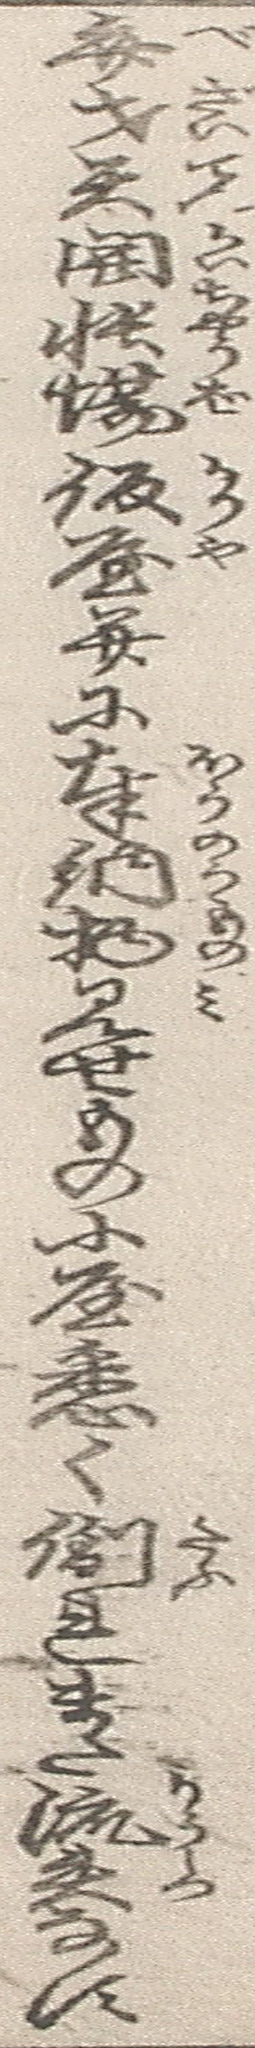弁才天開帳場仮屋并に奉納物見せもの小屋悉く倒れまた流失なす
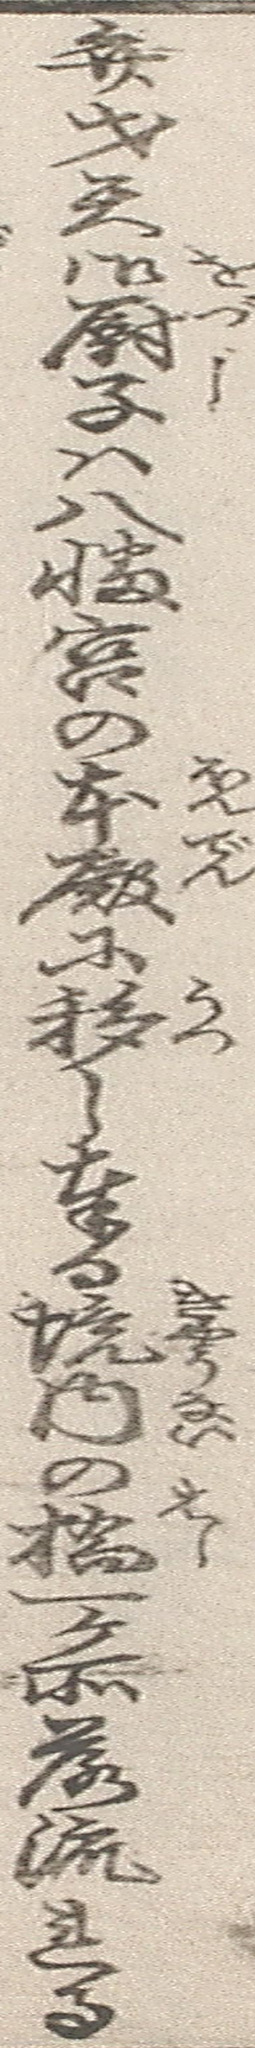弁才天御厨子ハ八幡宮の本殿に移し奉る境内の橋一ヶ所落流れる
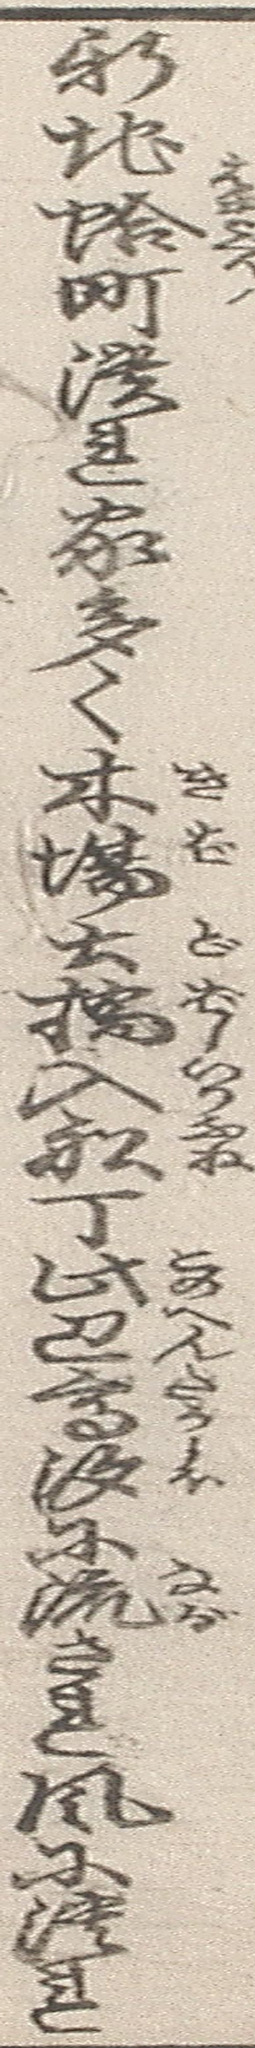新地蛤町潰れ家多く木場土橋入船丁此辺高汐に流され風に潰れ
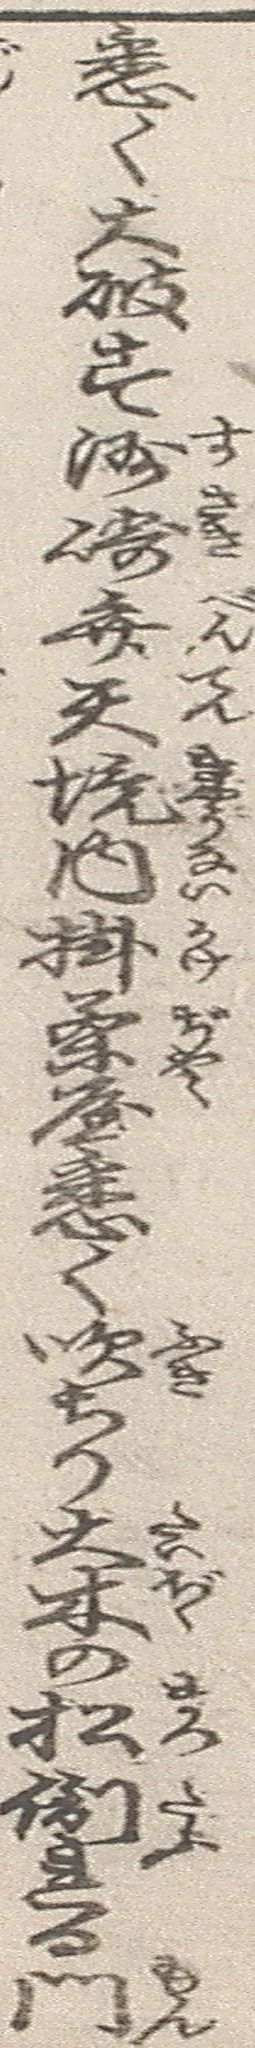悉く大破す砂崎弁天境内掛茶屋悉く吹ちり大木の松倒れる門
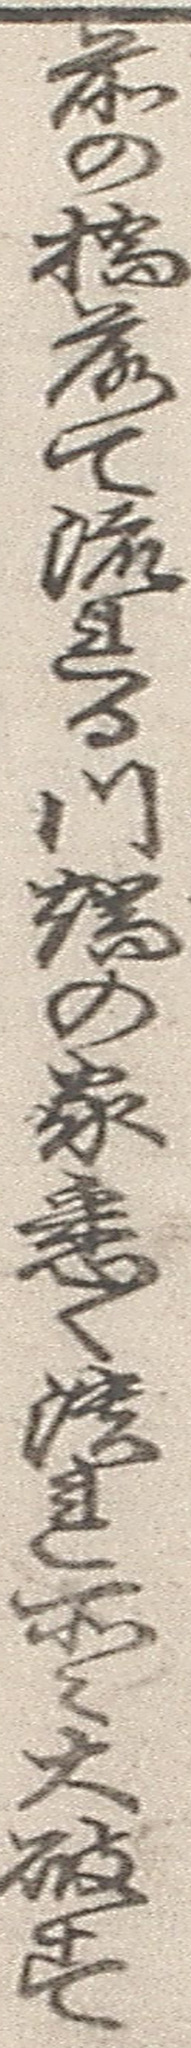前の橋落て流れる川端の家悉く潰れ所々大破す
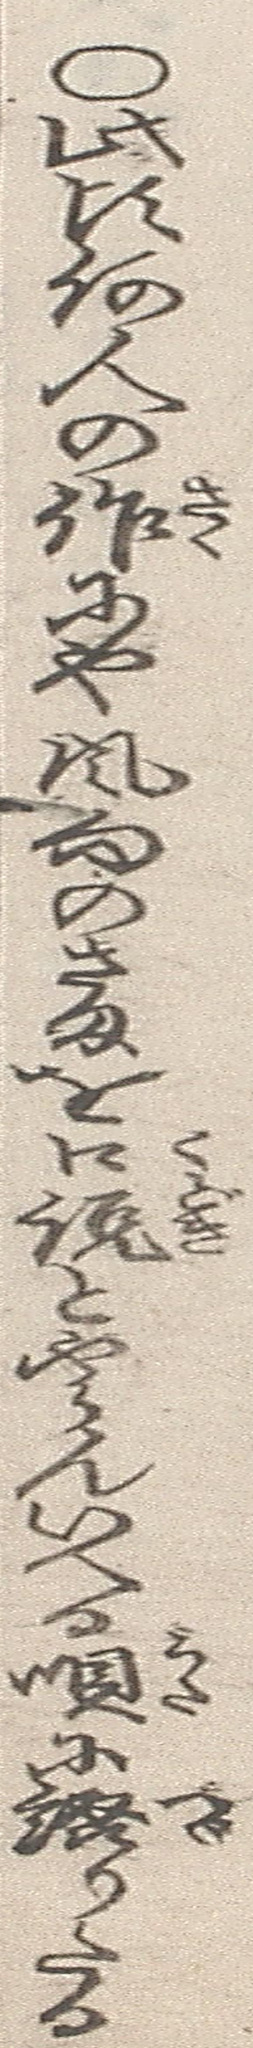◯此頃何人の作にや風向のさまを口説とやらんいへる唄に綴りたる
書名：安政風聞集　上中下　全
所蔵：東京大学地震研究所図書室 Earthquake Research Institute Library, The University of Tokyo, JAPAN
